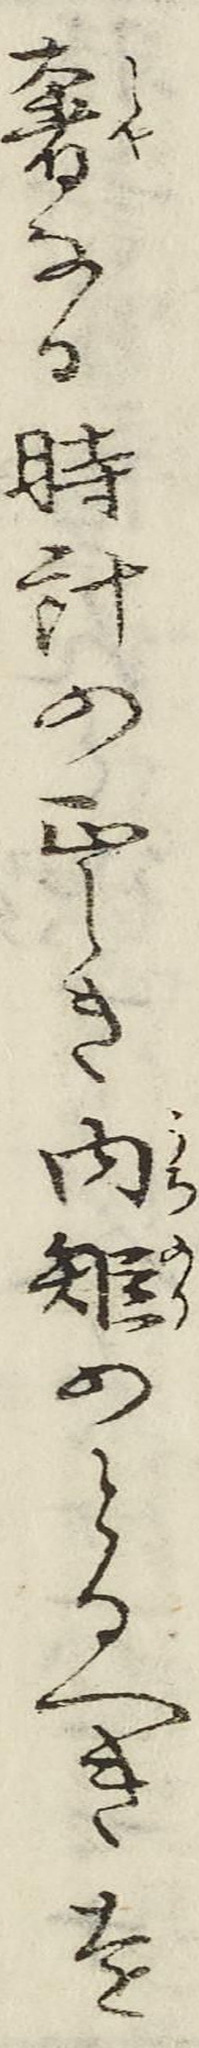奢なる時計の正しき内矩のとるへきを
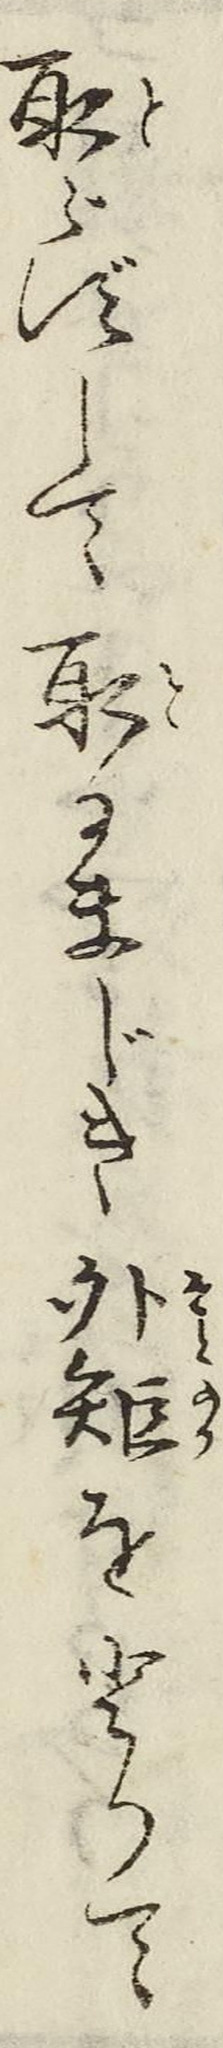取らずして取るまじき外矩をとりて
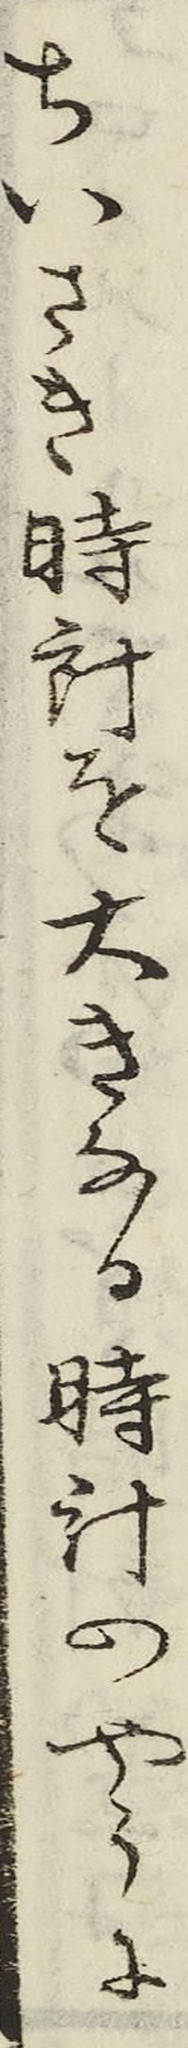ちいさき時計を大きなる時計のやうに
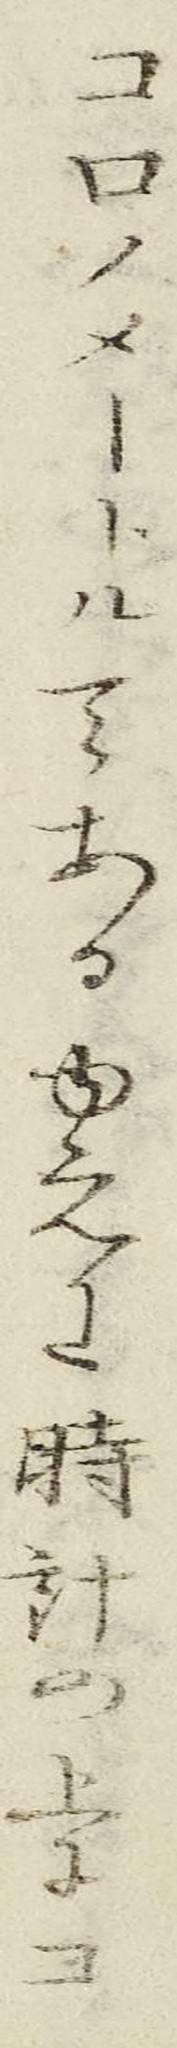コロノメートルてあるゆえに時計の上にコ
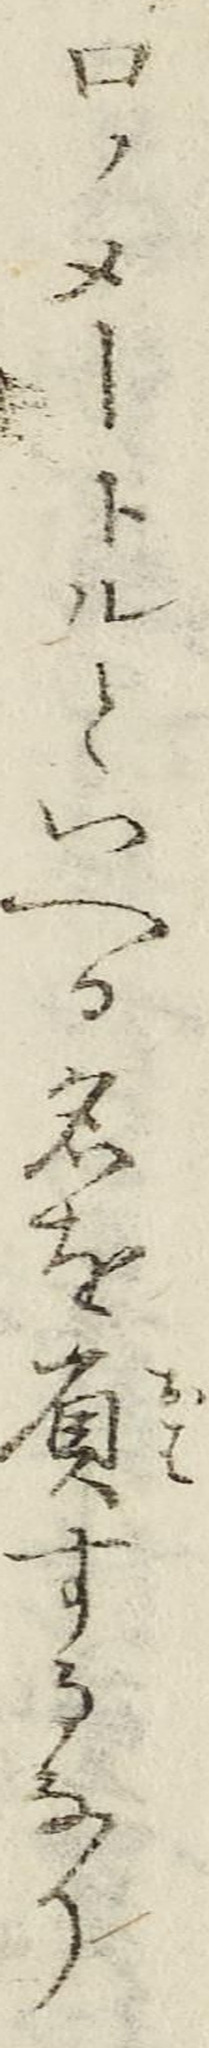ロノメートルといへる名を負するなり
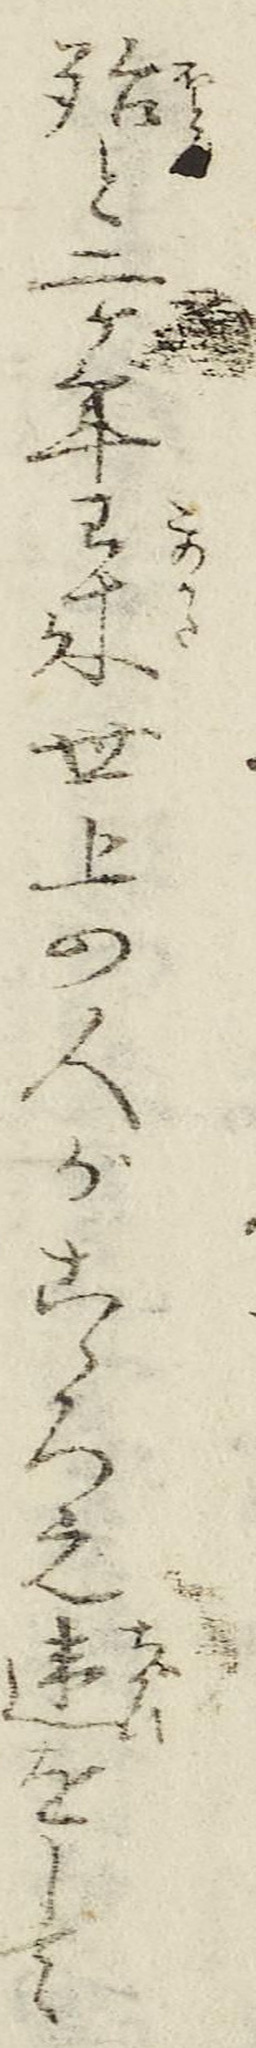殆と二ヶ年已来世上の人がこゝろえ違をして
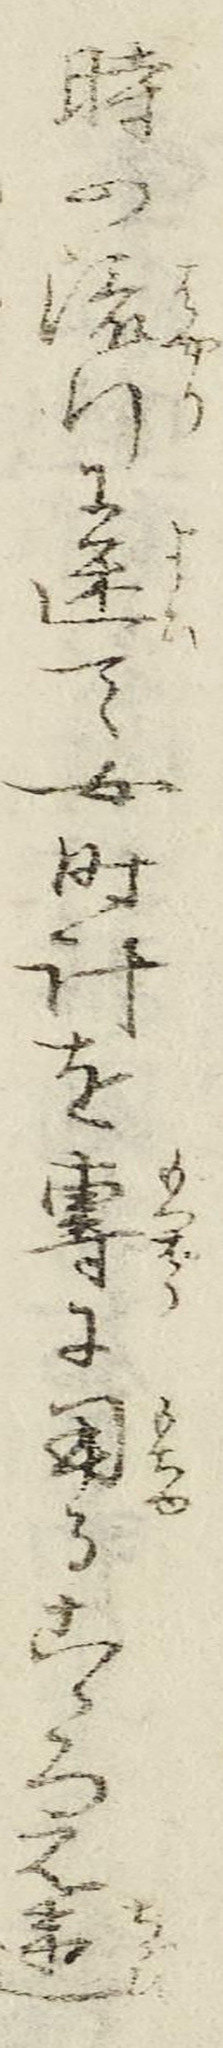時の流行に迷て女時計を専に用るこゝろえ違
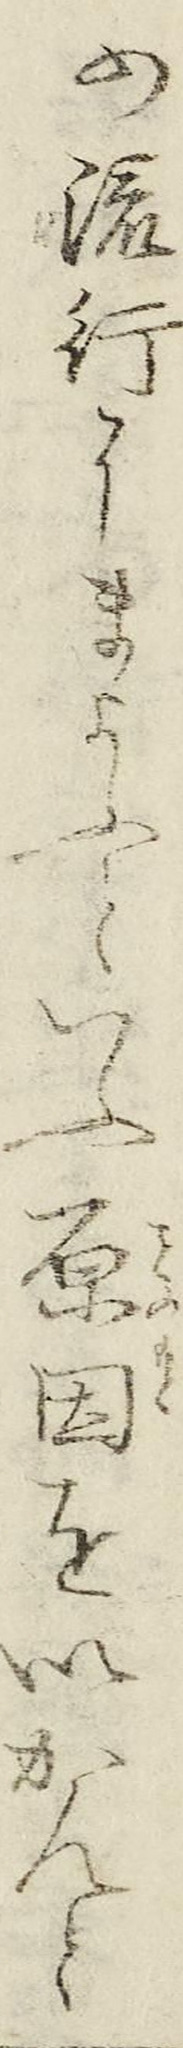の流行にまよふといふ原因をいかんと
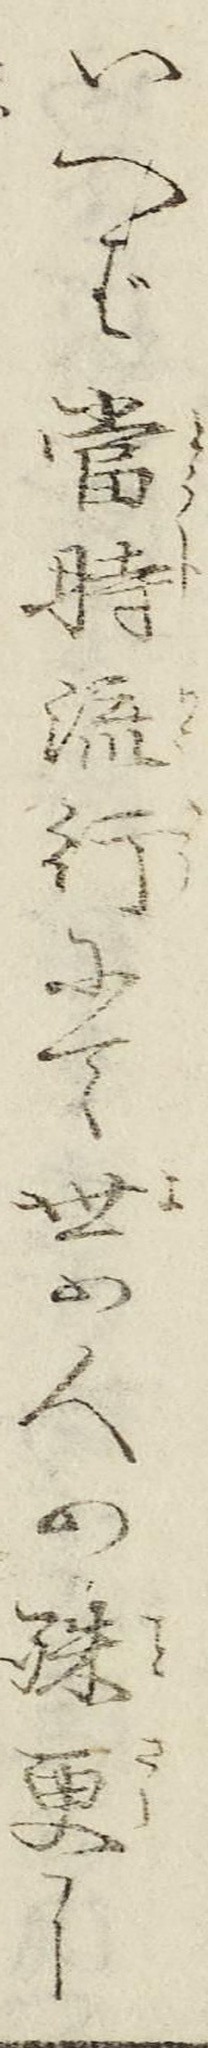いへば当時流行にて世の人の殊更に
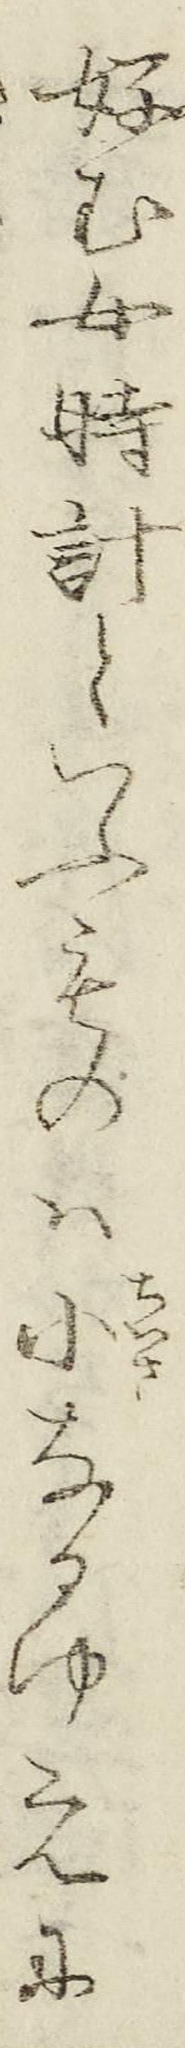好む女時計といふものは小なるゆえに
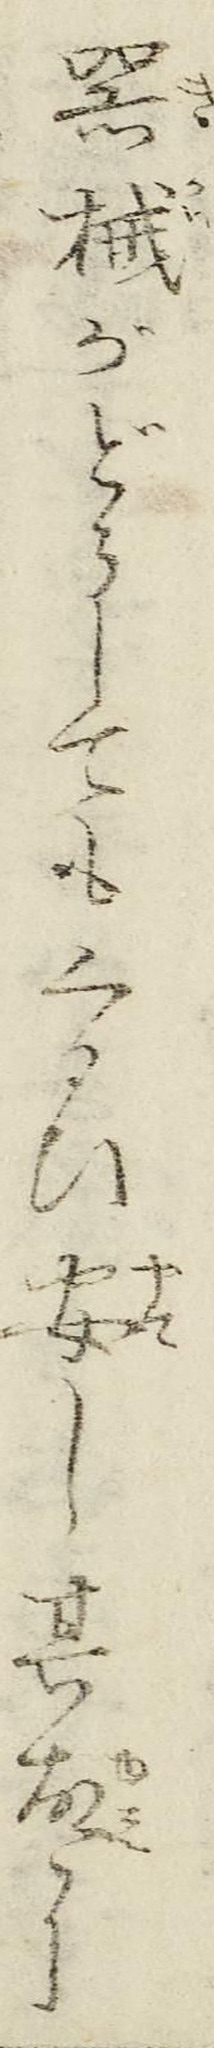器械がどうしてもくるひ安し其故に
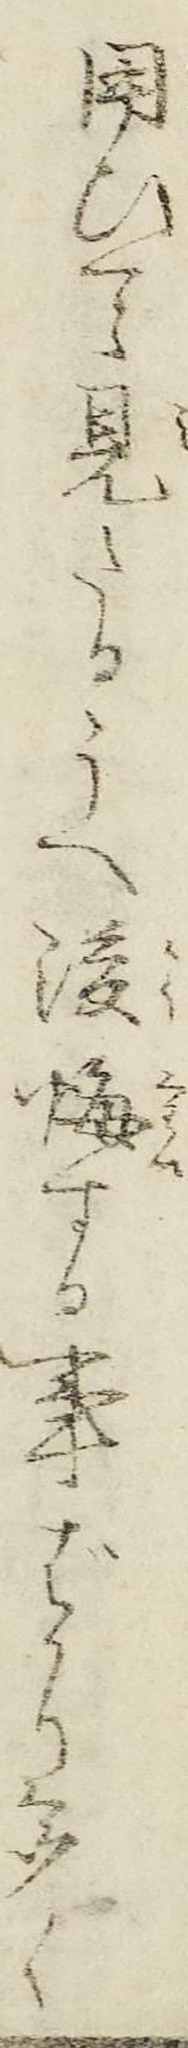用ひて見たるうへ後悔する事ばかり多く
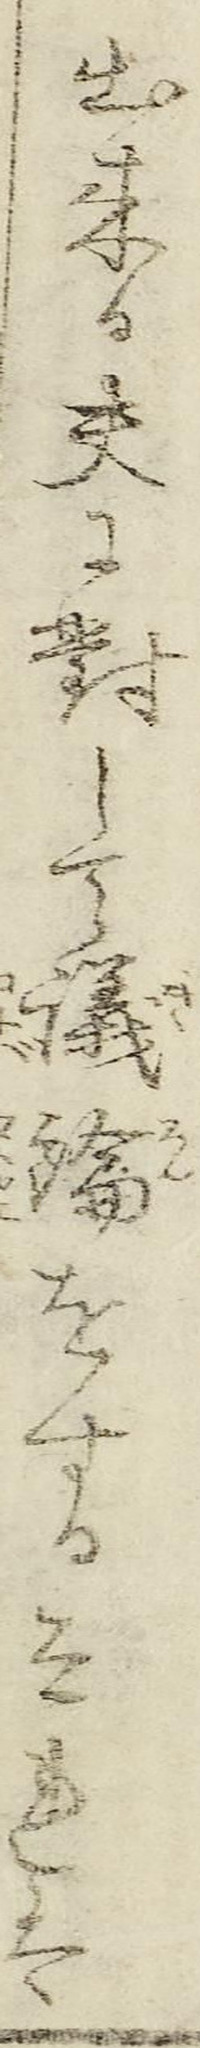出来る夫に対して議論をするそれは

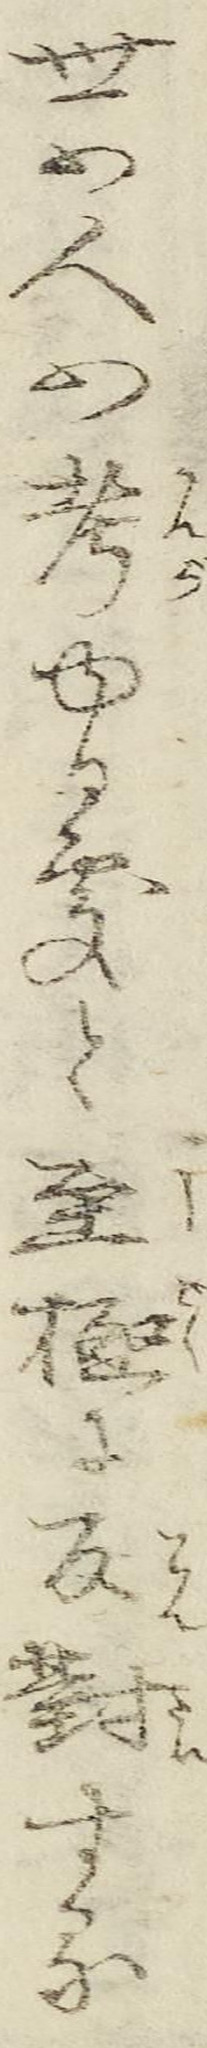世の人の考ゆる処と至極に反対する
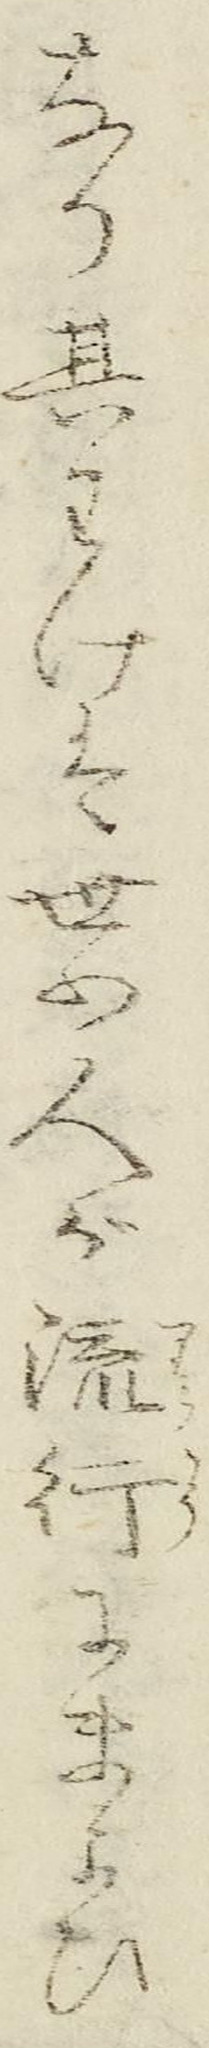なり其わけは世の人が流行にまよひ
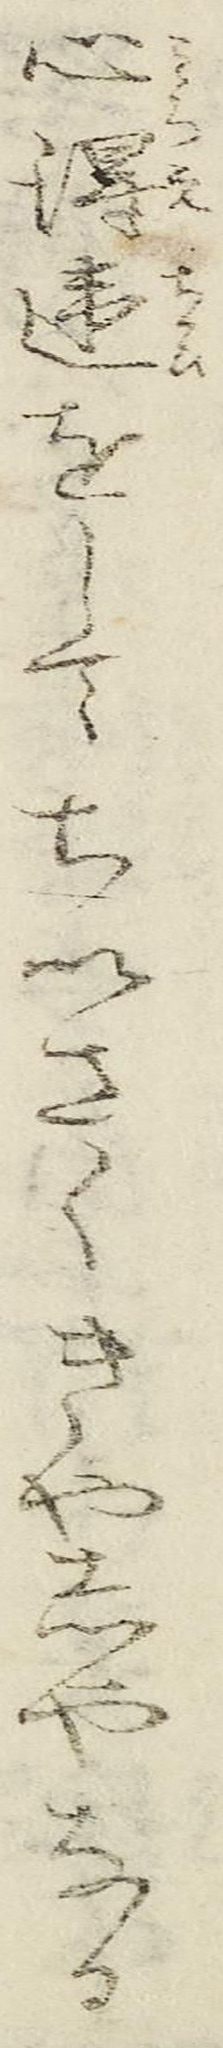心得違をしてちいさくきやしやなる
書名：[時計に関する冊子]
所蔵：東京大学地震研究所図書室 Earthquake Research Institute Library, The University of Tokyo, JAPAN
